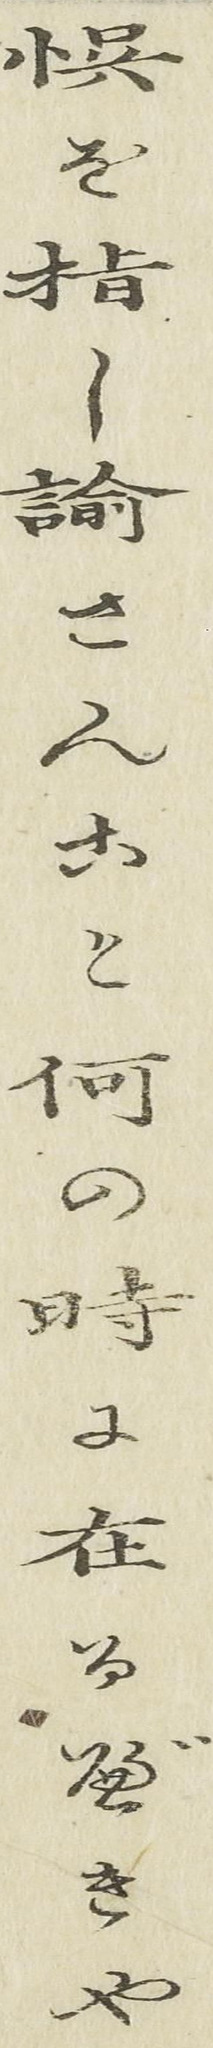誤を指し諭さんこと何の時に在るべきや
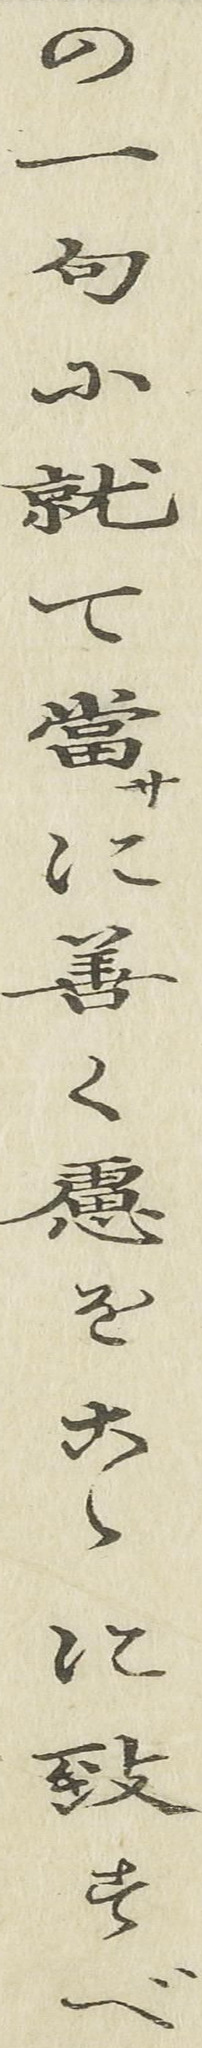の一句に就て當さに善く慮をこゝに致すべ

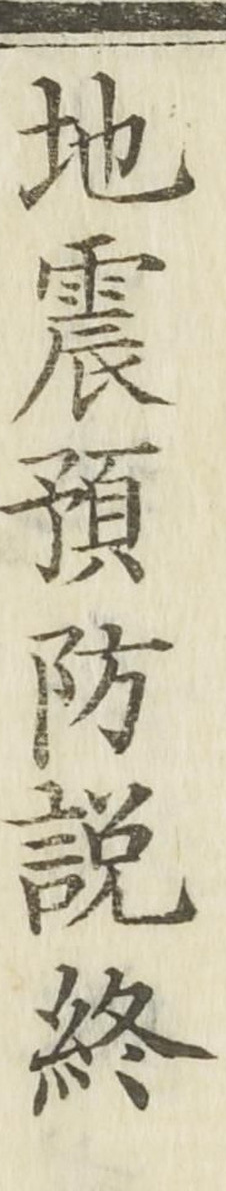地震預防説終
